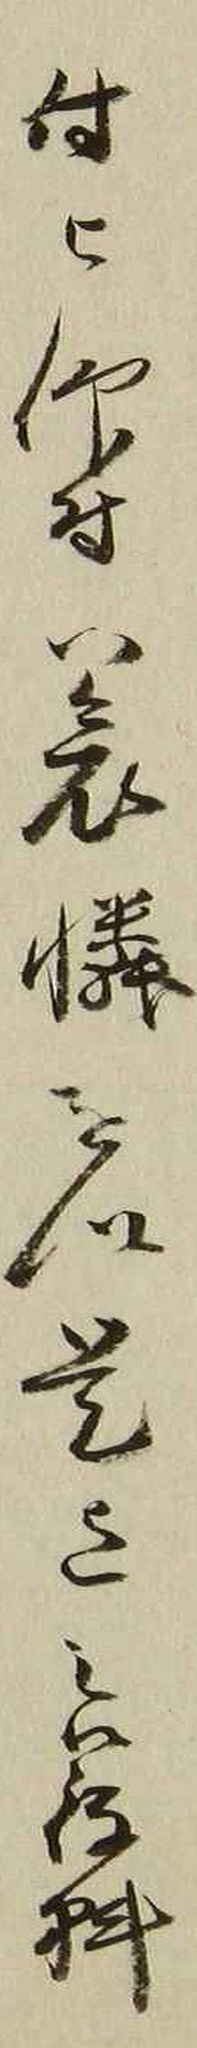付被仰付御哀憐を以是迄之御役料
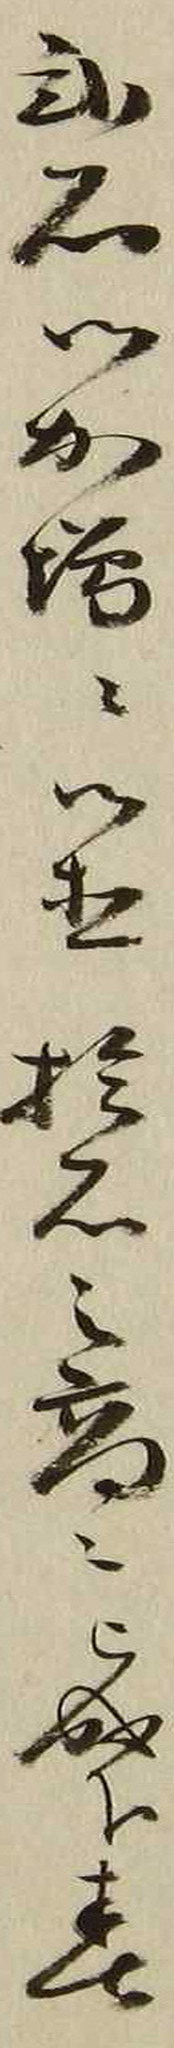弐石御加増ニ御直拾石之高ニ被成下春
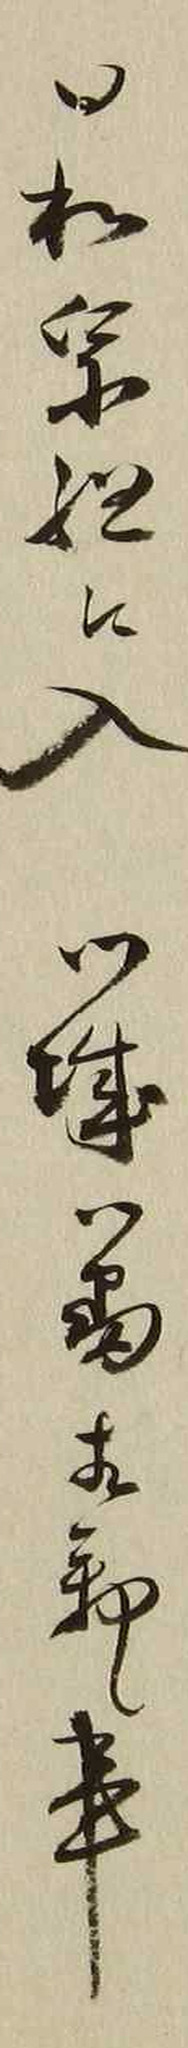日和泉組江入御城御番相勤候事
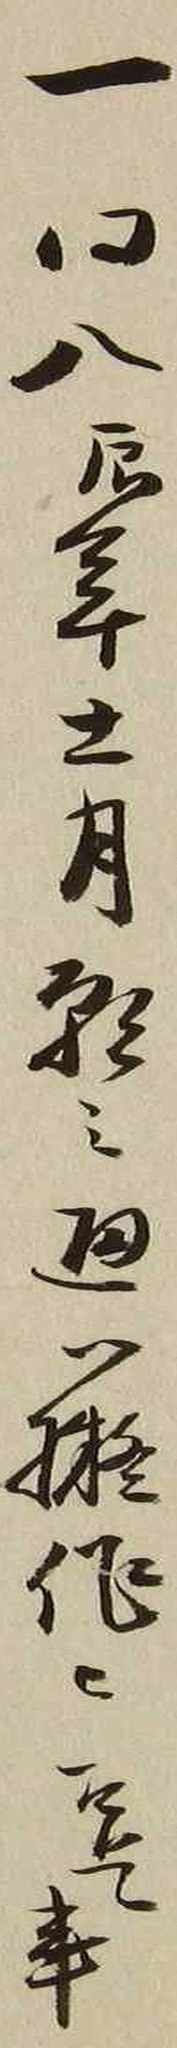一同八辰年十一月願之通御擬作被召上候事
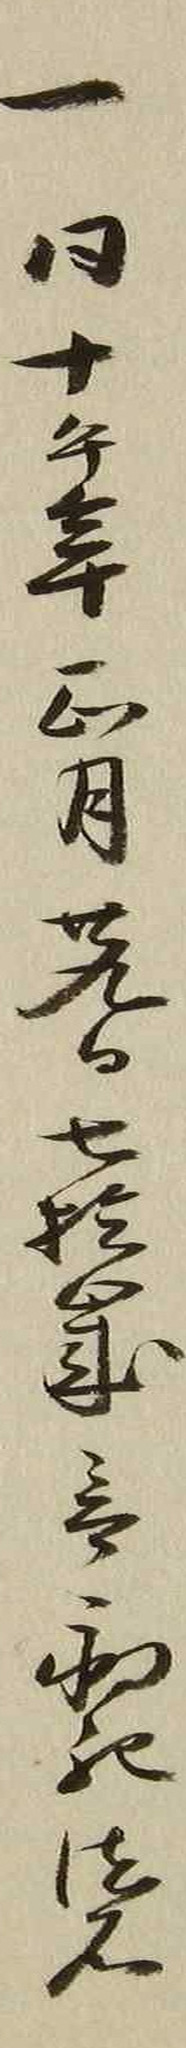一同十午年正月廿九日七拾歳ニ而病死法名
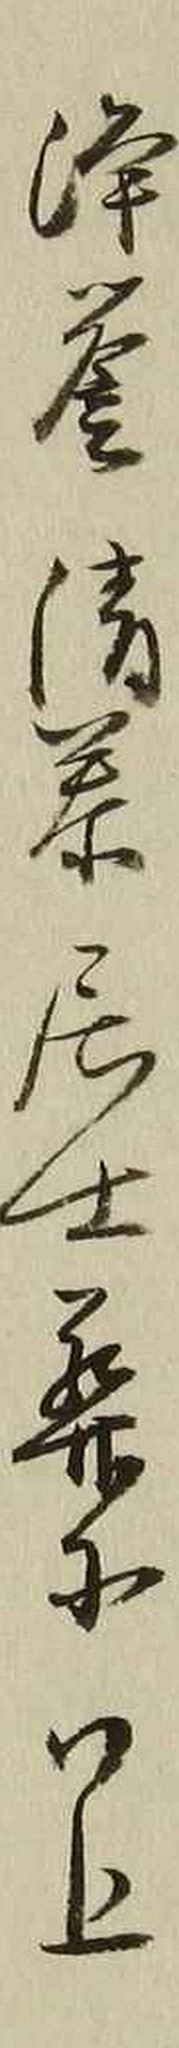浄誉清泰居士葬所同上
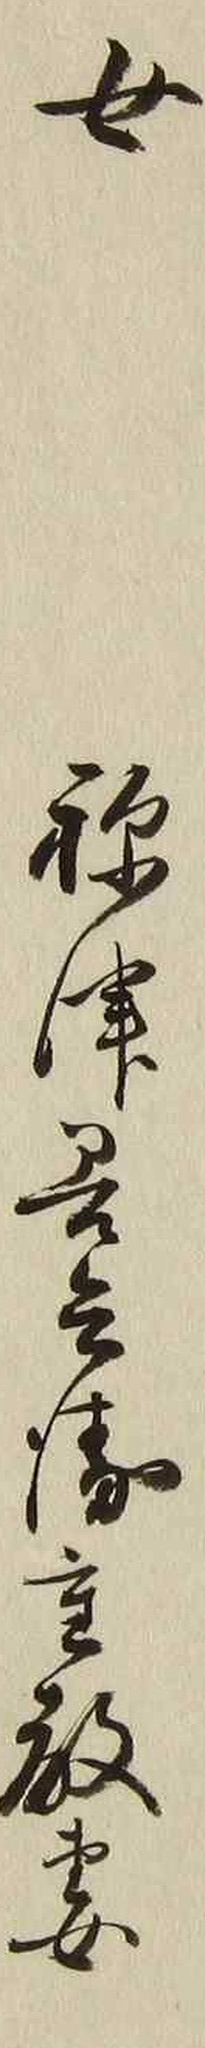女祢津善兵衛重教妻
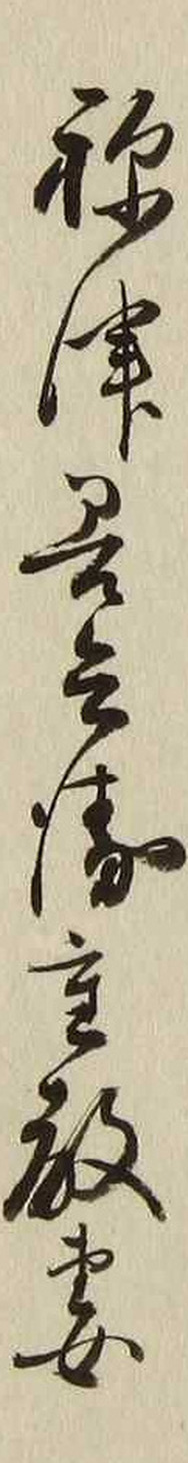女祢津善兵衛重教妻
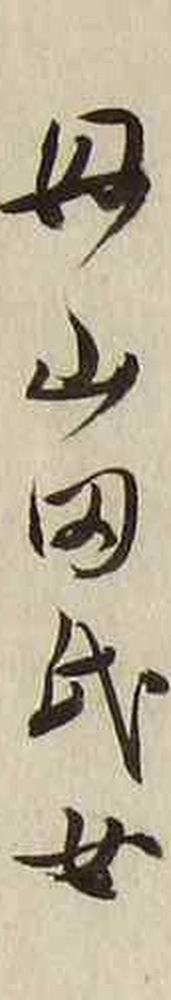母山田氏女

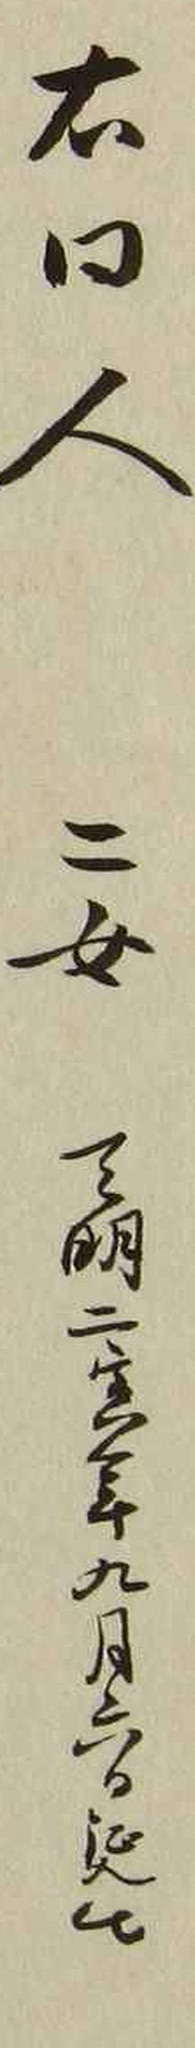右同人二女天明二寅年九月六日誕生
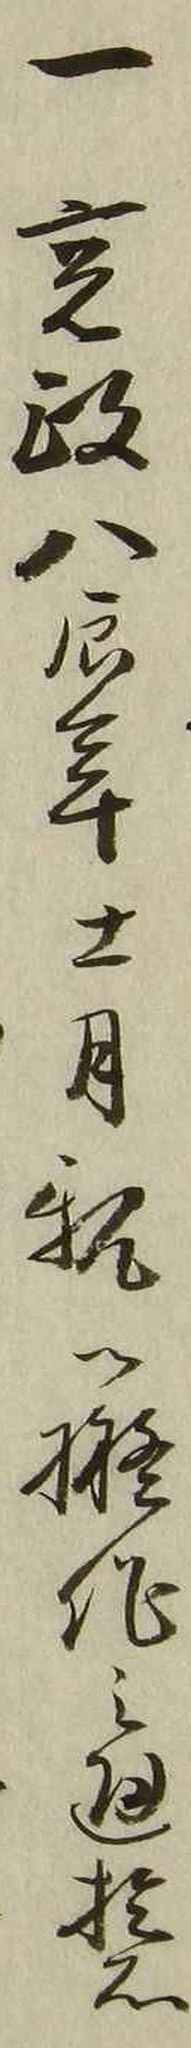一寛政八辰年十一月親御擬作之通拾石
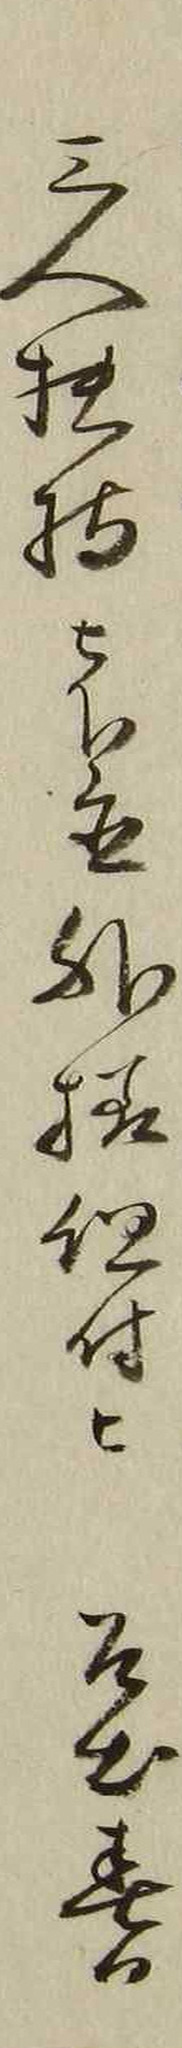三人扶持被下置外様組付被召出春日
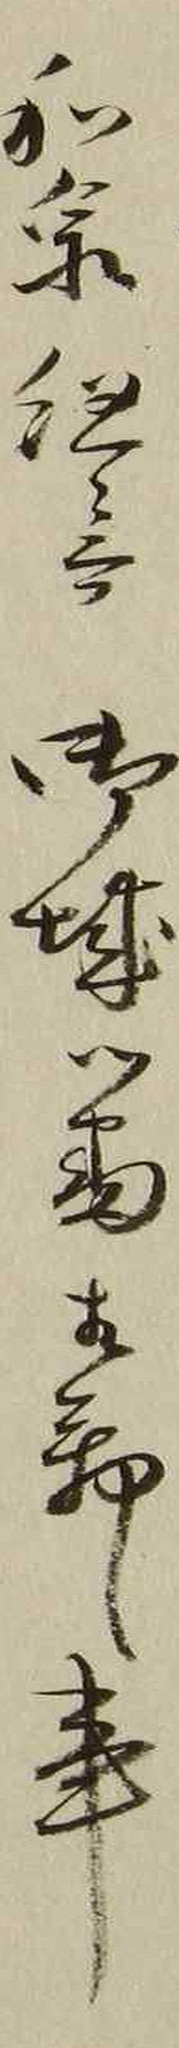和泉組ニ而御城御番相勤候事
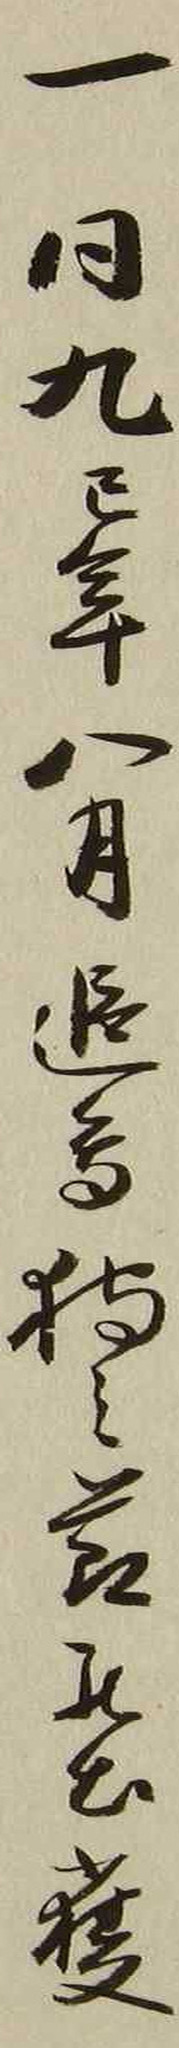一同九巳年八月追鳥狩之節罷出獲
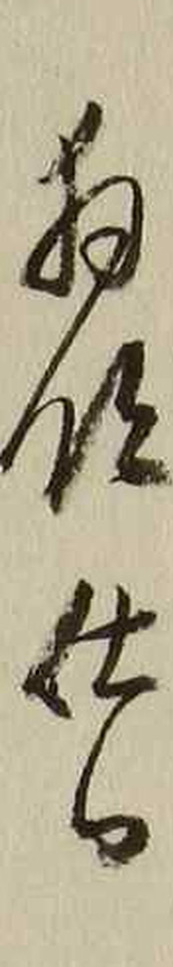拝領仕候
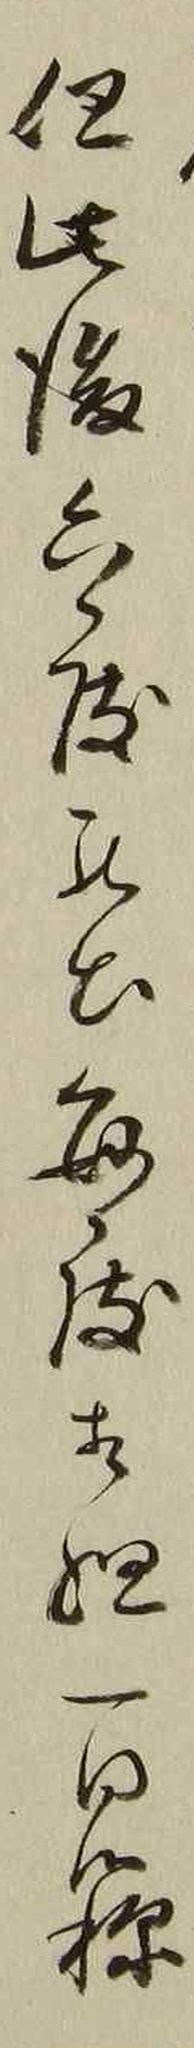但此後六度罷出毎度相組一同御称
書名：諸士系譜　巻之288　さ之部20
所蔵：会津若松市立会津図書館
